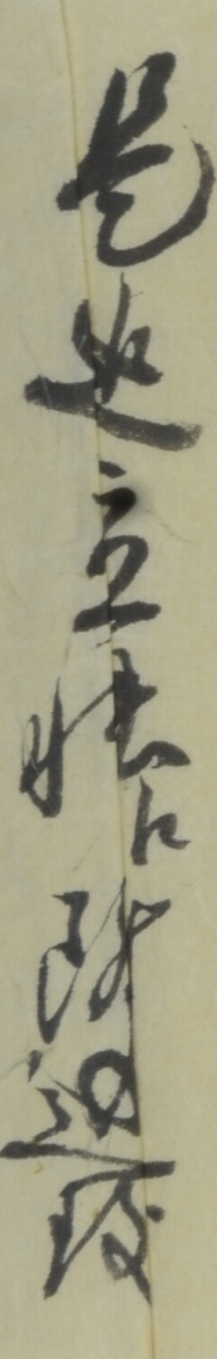是迄立帳江附込致

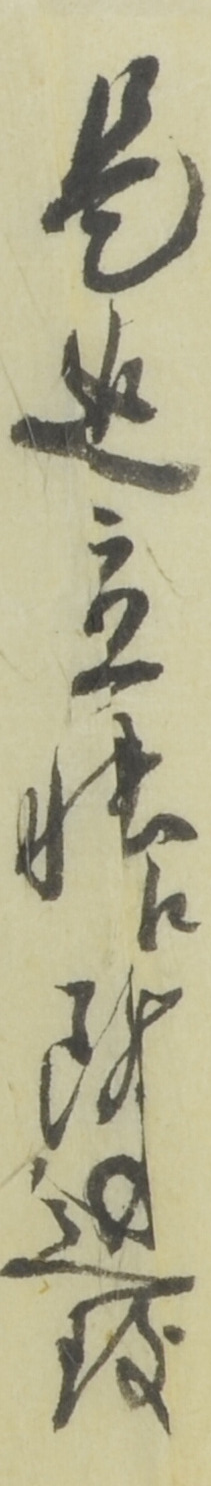是迄立帳江附込致
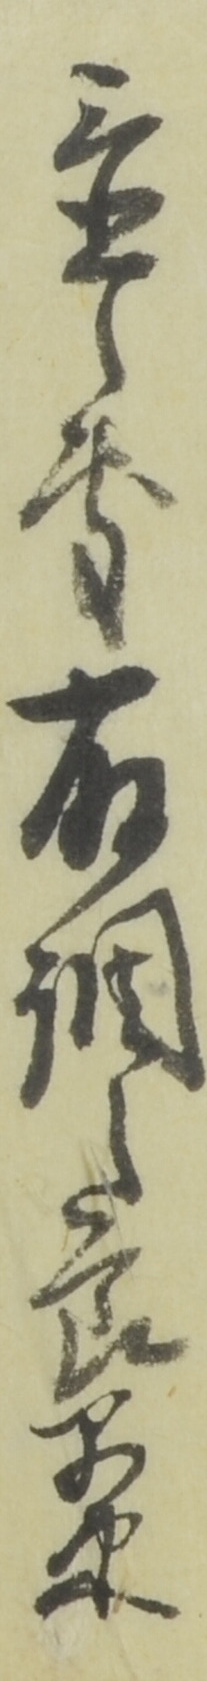置候処取調之節早束
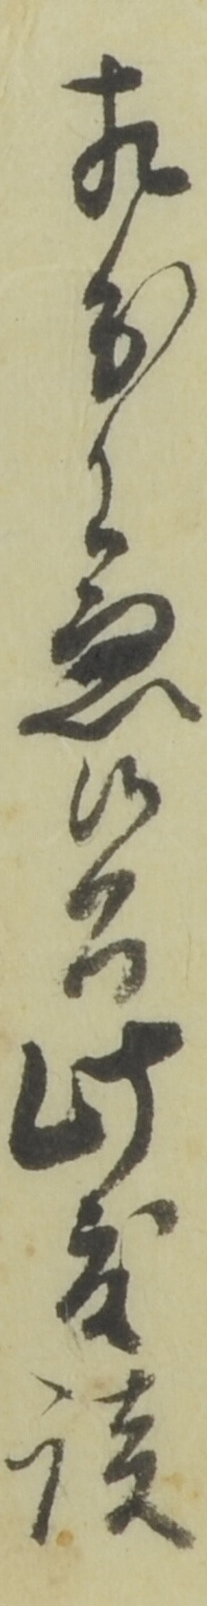相分り兼候間此度談
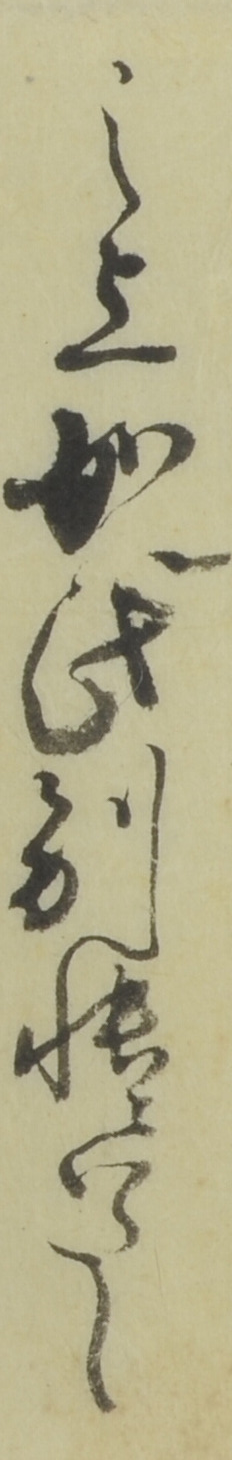之上如此別帳にいたし
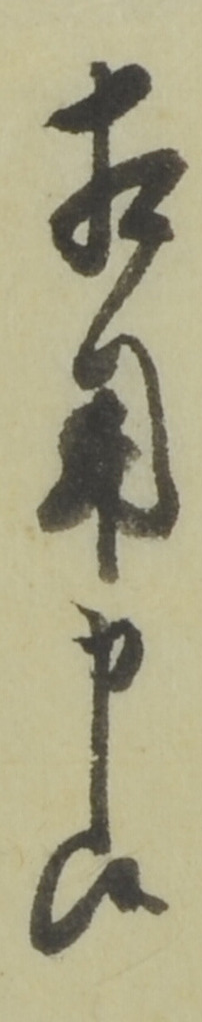相用申候
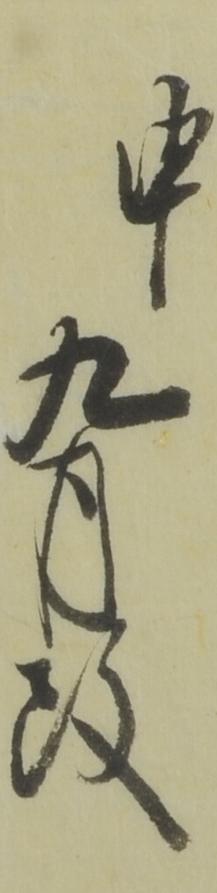申九月改
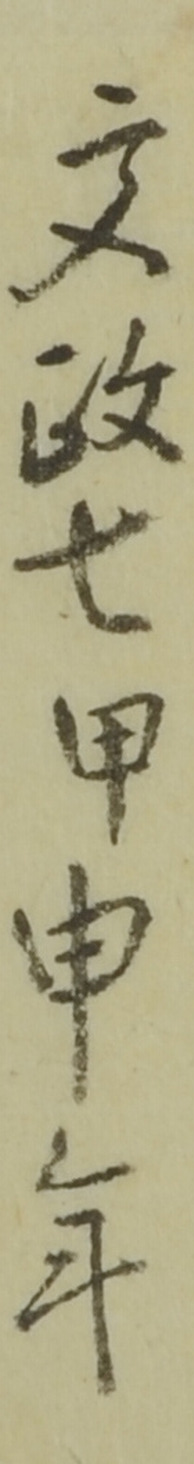文政七甲申年

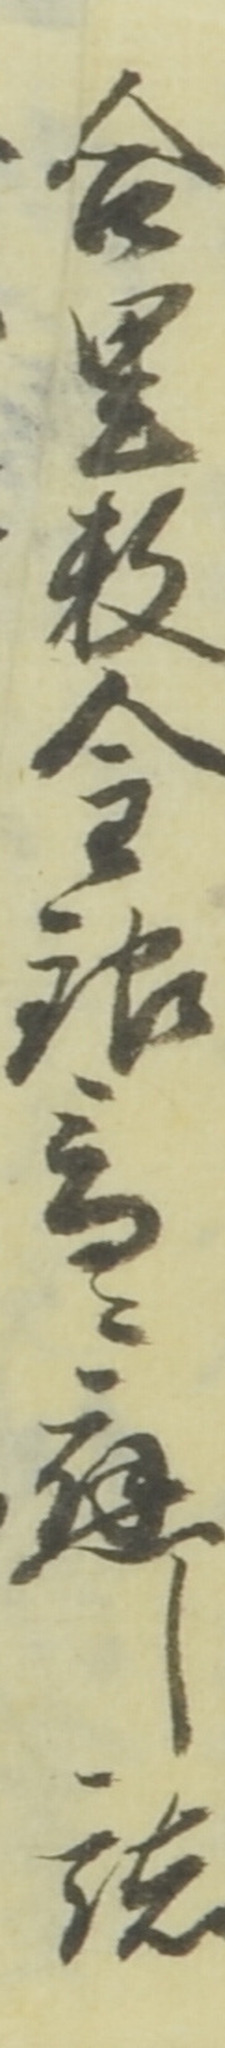合里数金銀高ニ応し諸
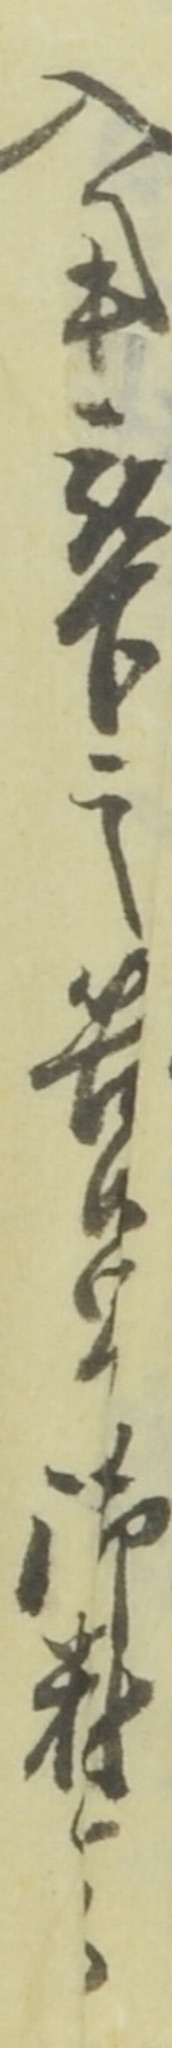入用被下之筈候間御料は
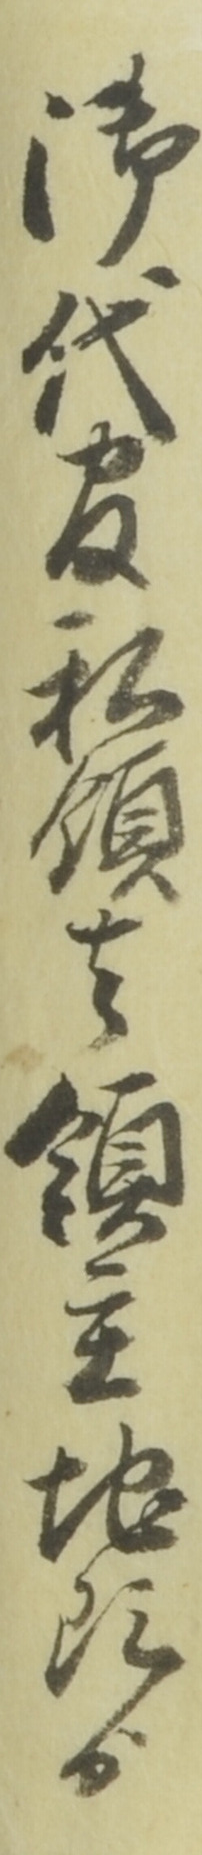御代官私領は領主地頭ゟ
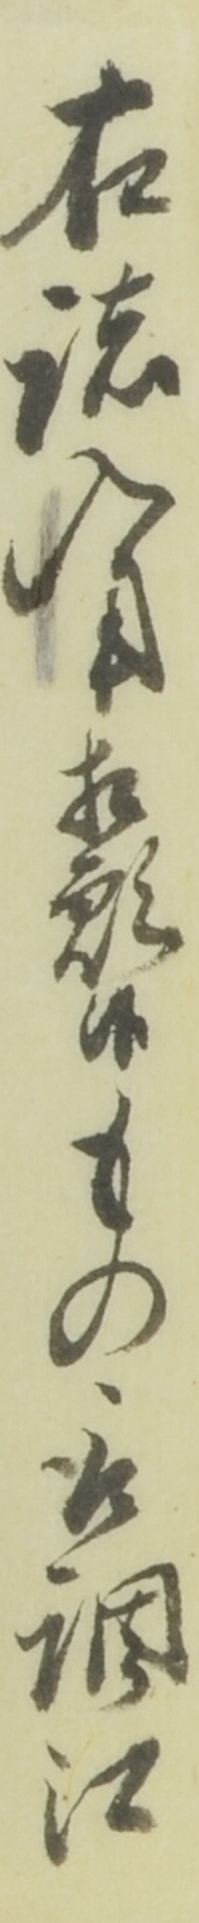右諸入用相願候もの取調江
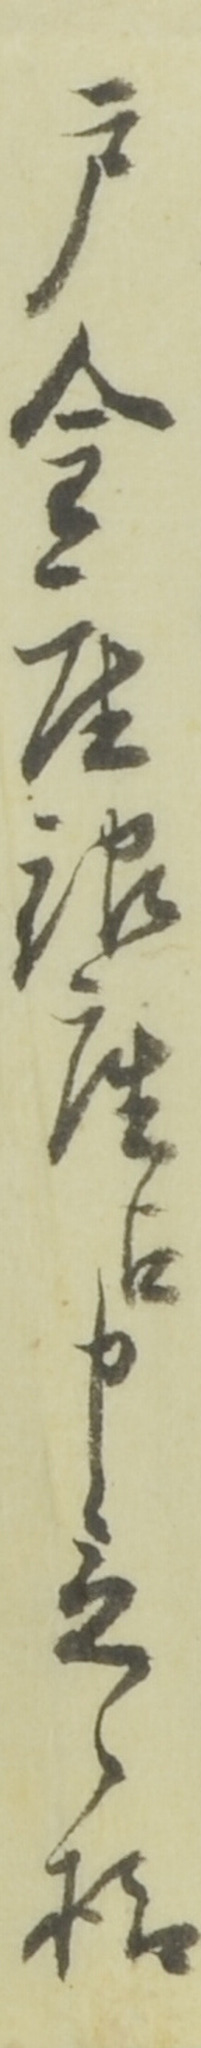戸金座銀座江申立候様
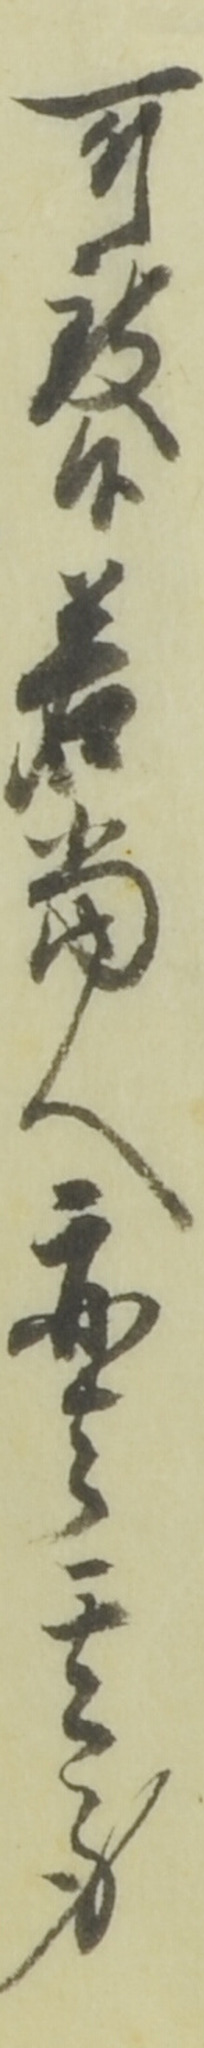可致候若当人亦は其身
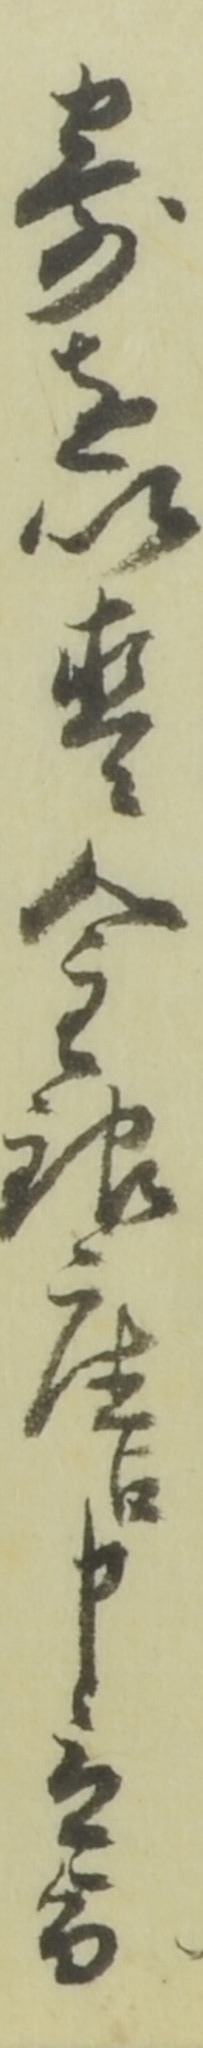寄を以直ニ金銀座江申立旨
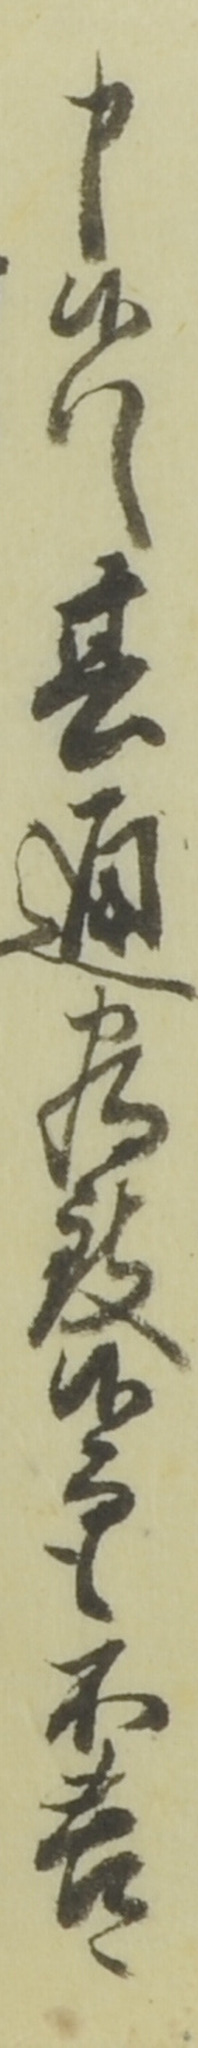申候ハヽ其通為致候而も不苦候
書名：御触書御書附控
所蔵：伊那市立高遠町図書館・合同会社AMANE
